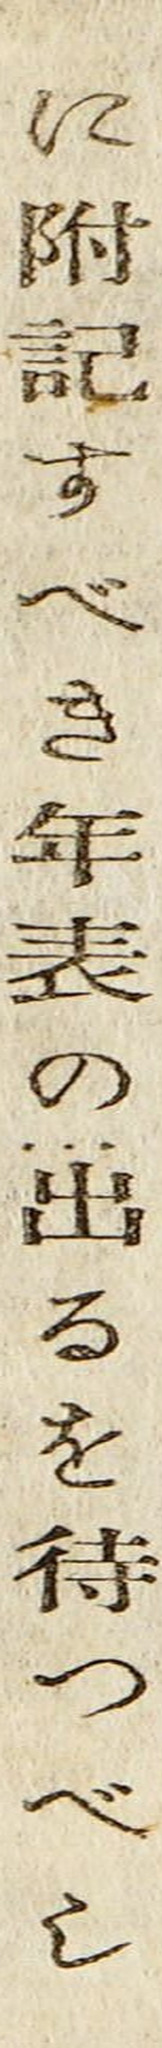に附記すべき年表の出るを待つべし
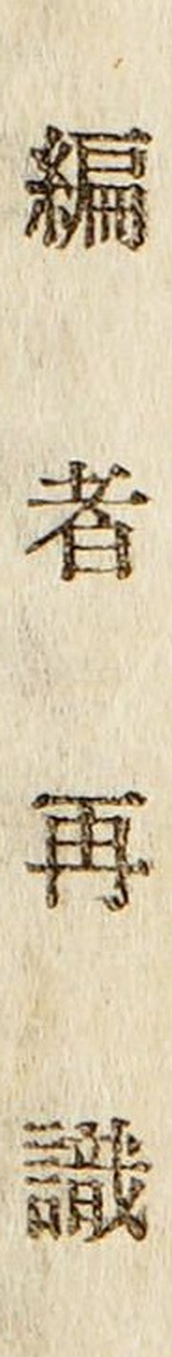編者再識
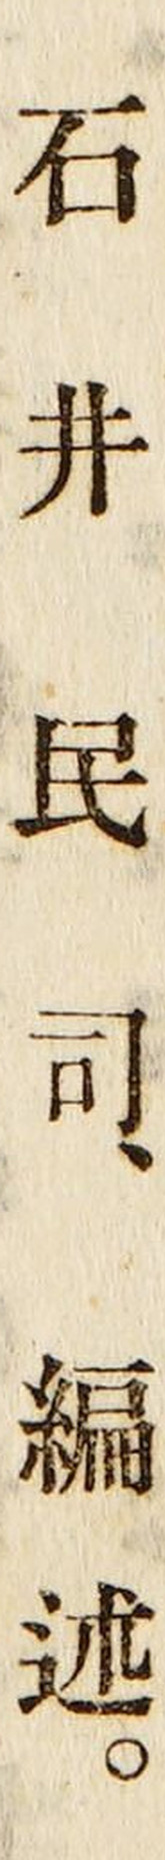石井民司、編述。
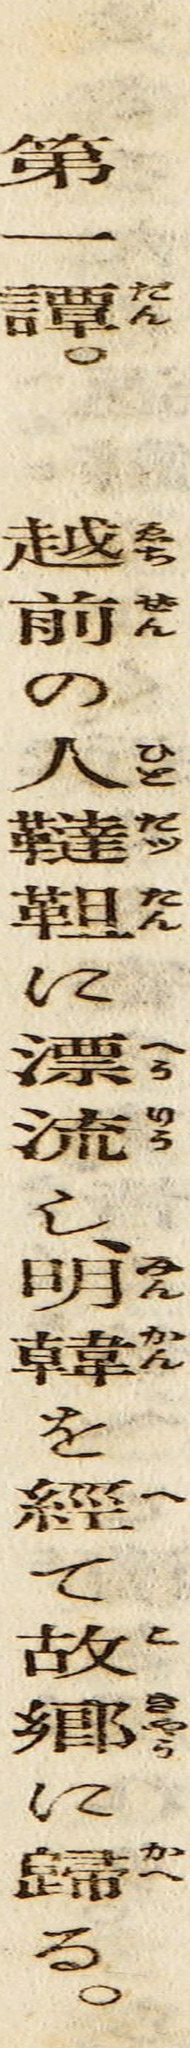第一譚。越前の人韃靼に漂流し、明韓を経て故郷に帰る。
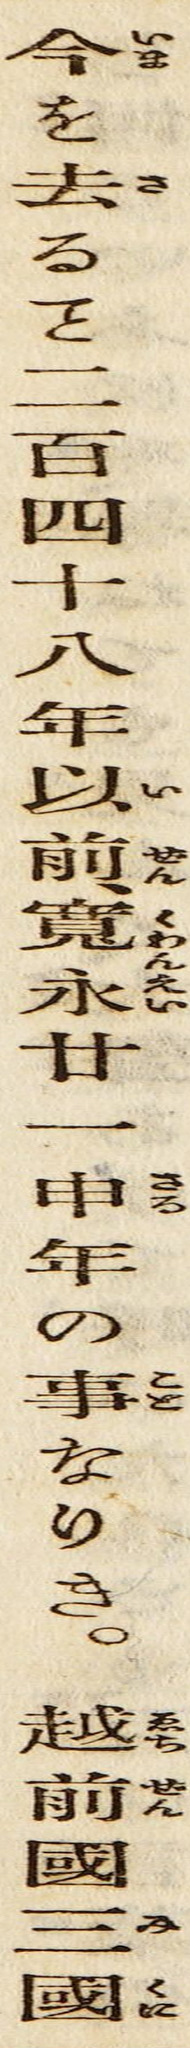今を去ること二百四十八年以前、寛永廿一申年の事なりき。越前国三国
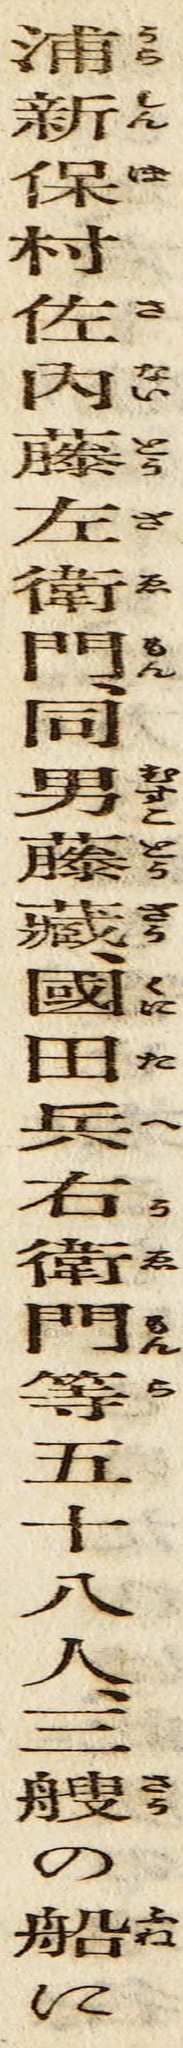浦新保村佐内藤左衛門、同男藤蔵、国田兵右衛門等五十八人、三艘の船に
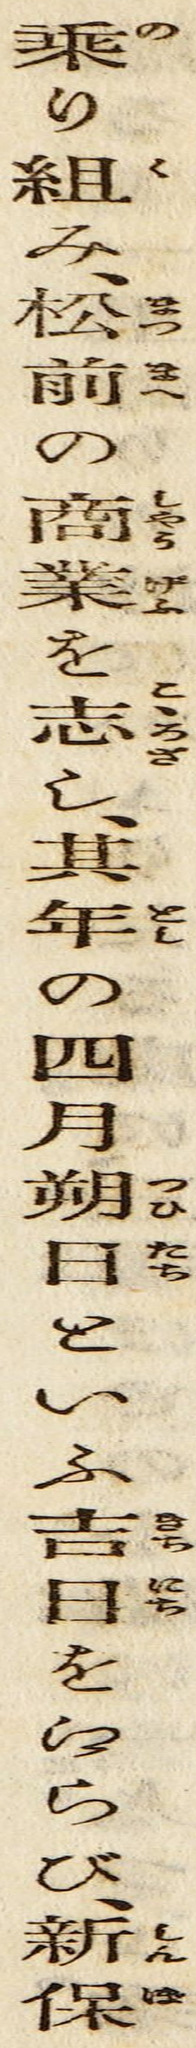乗り組み、松前の商業を志し、其年の四月朔日といふ吉日をえらび、新保
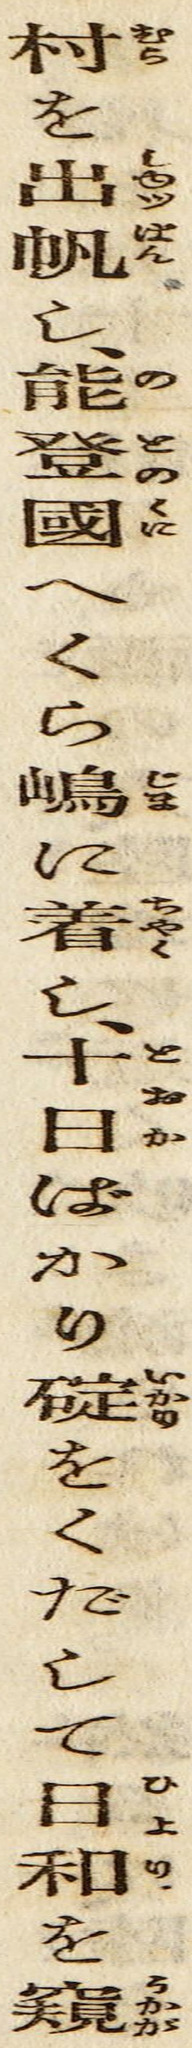村を出帆し、能登国へくら嶋に着し、十日ばかり碇をくだして日和を窺
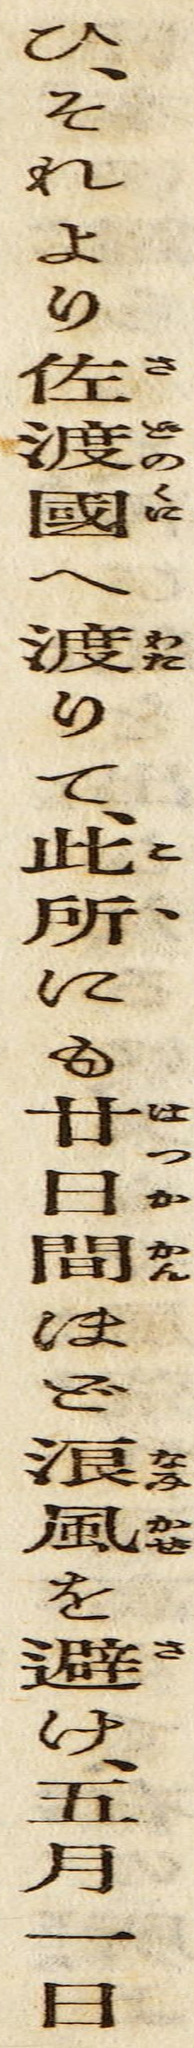ひ、それより佐渡国へ渡りて、此所にも廿日間ほど浪風を避け、五月一日
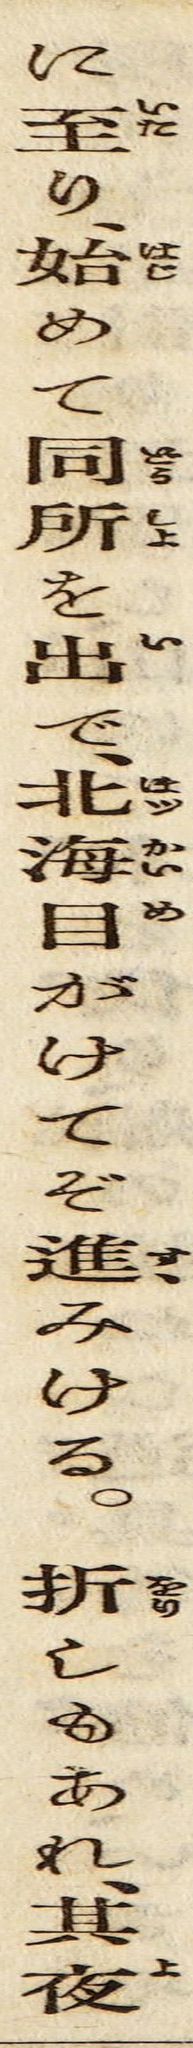に至り、始めて同所を出で、北海目がけてぞ進みける。折しもあれ、其夜
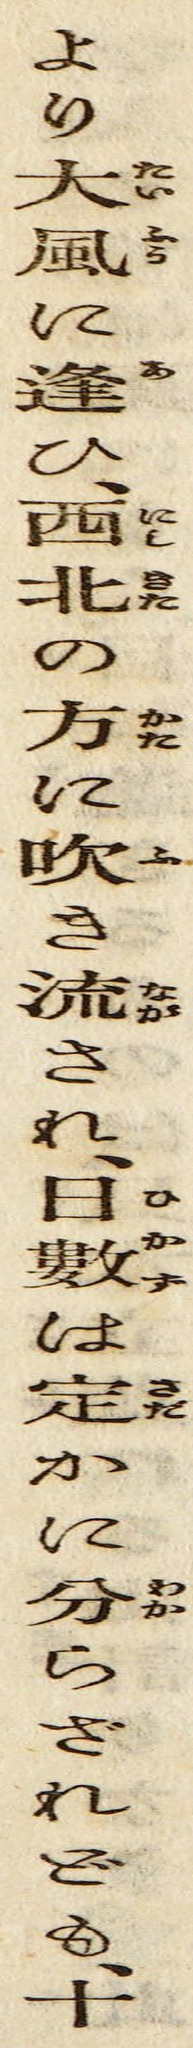より大風に逢ひ、西北の方に吹き流され、日数は定かに分らざれども、十
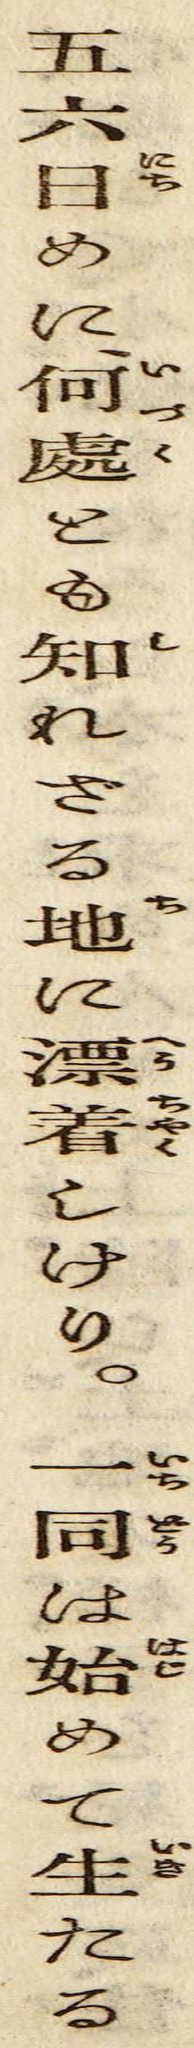五六日めに、何処とも知れざる地に漂着しけり。一同は始めて生たる

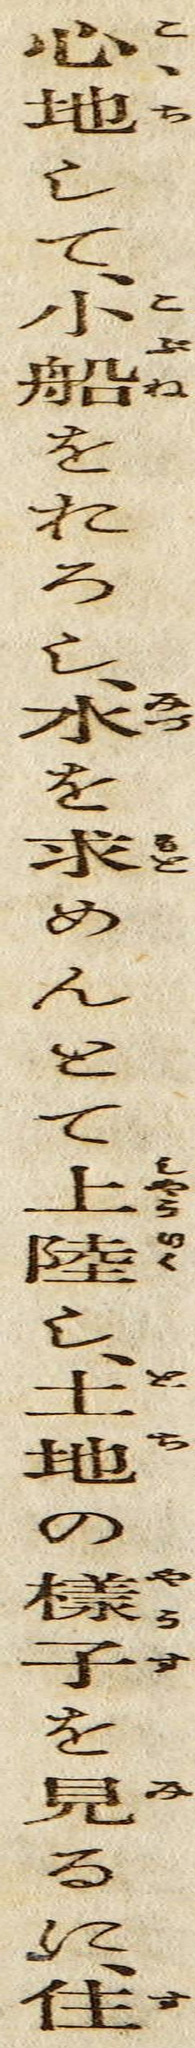心地して、小船をおろし、水を求めんとて上陸し、土地の様子を見るに、住
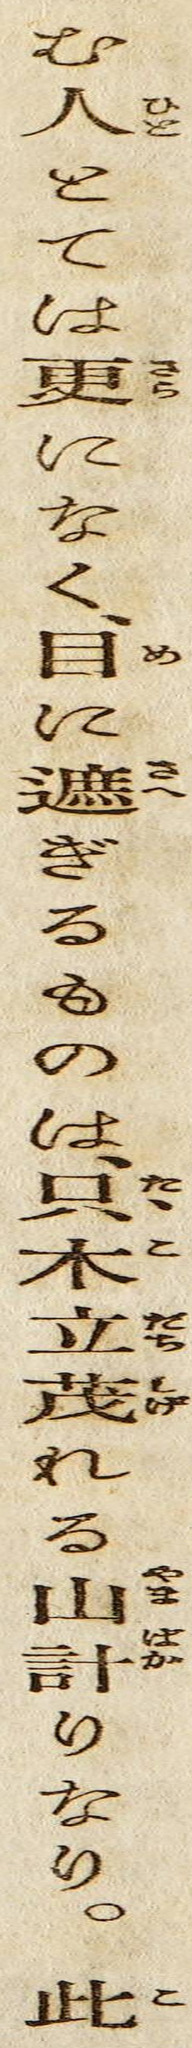む人とては更になく、目に遮ぎるものは、只木立茂れる山計りなり。此
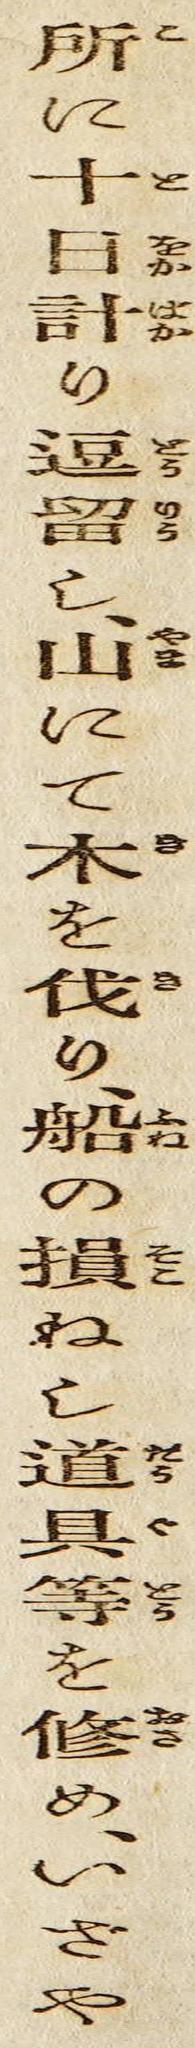所に十日計り逗留し、山にて木を伐り、船の損ねし道具等を修め、いざや
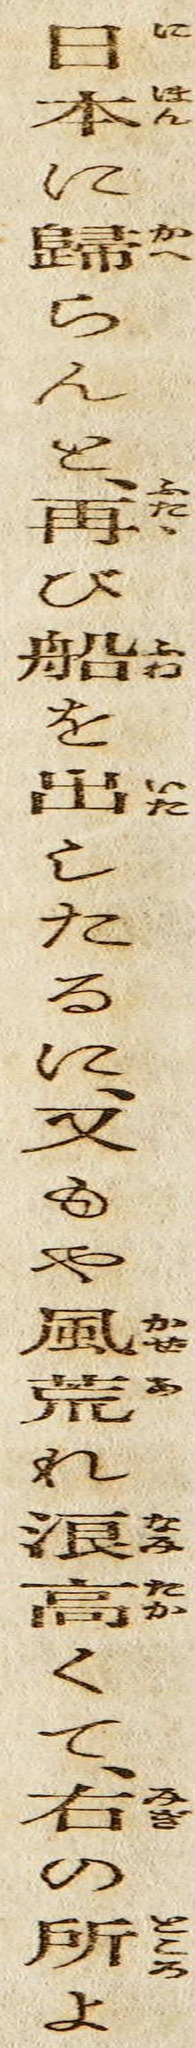日本に帰らんと、再び船を出したるに、又もや風荒れ浪高くて、右の所よ
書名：日本漂流譚
